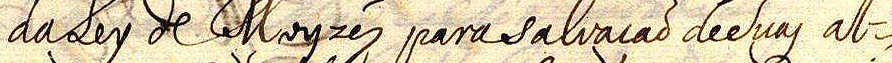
da Ley de Moyzés para salvaçaõ de suas al
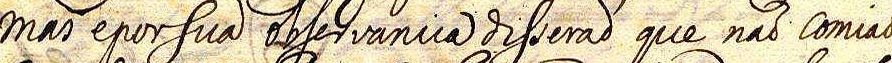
mas e por sua observancia disseraõ que naõ comiaõ
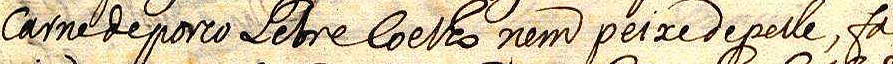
carne de porco Lebre Coelho nem peixe de pelle, fa
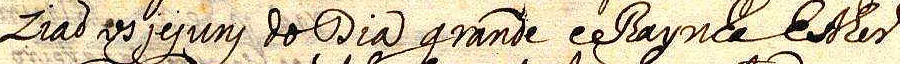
ziaõ os jejuns do Dia grande e Raynha Esther
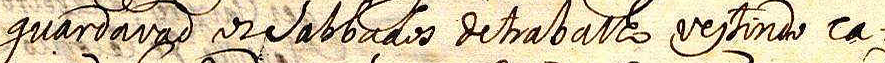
guardavaõ os sabbados de trabalho vestindo ca
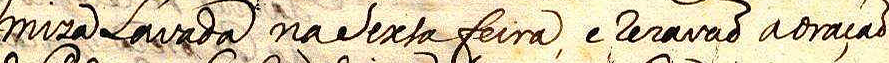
miza Lavada na sexta feira, e Rezavaõ a oraçaõ
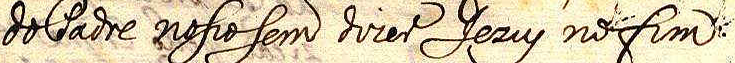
do Padre nosso sem dizer Jezus no fim.
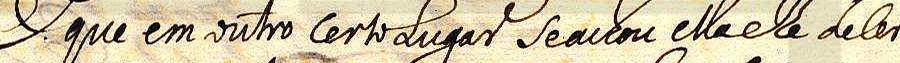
P. que em outro certo Lugar se achou ella Re de Cer
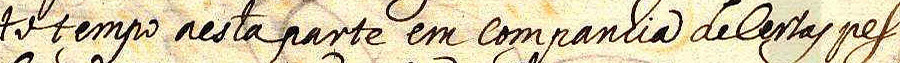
to tempo a esta parte em companhia de Certas pes
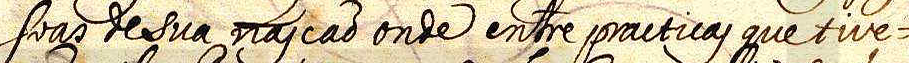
soas de sua nasçaõ onde entre praticas que tive
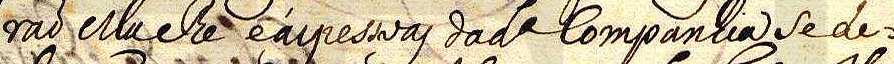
raõ ella Re e ás pessoas da da Companhia se de
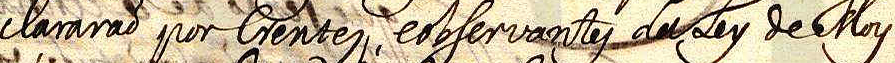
clararaõ por Crentes, e observantes da Ley de Moy
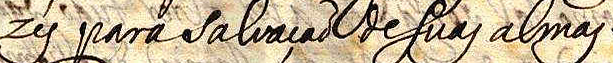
zés para salvaçaõ de suas almas.
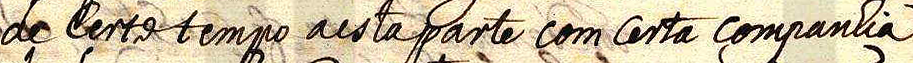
de Certo tempo a esta parte com certa Companhia
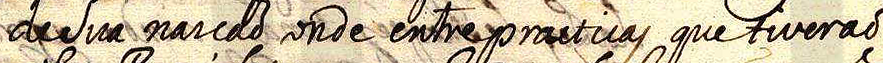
de Sua nasçaõ onde entre practicas que tiveraõ
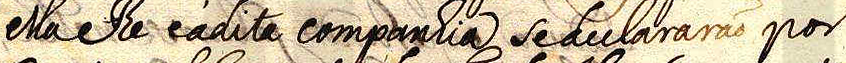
ella Re e a dita companhia se declararaõ por
